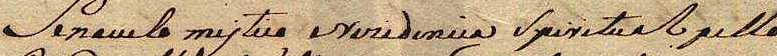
Senaculo mistico, e rezidencia spiritual pello
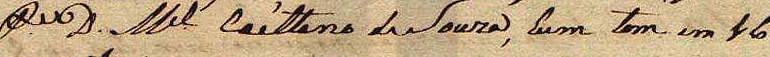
Pe. D. Mel. Caettano de Souza, hum tom em 16
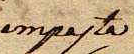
em pasta
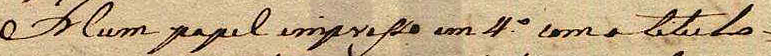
Hum papel impresso em 4.o com o título
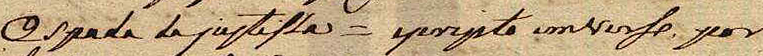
Espada da justissa = escripto em verso por
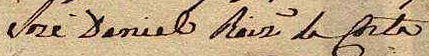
Ioze Daniel Roiz̄ da Costa
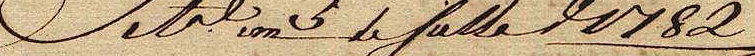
Setal. em 5 de julho d̄ 1782
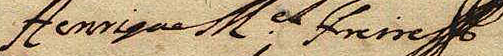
Henrique Mel. Freire
